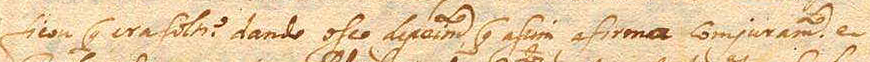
ficou q̄ era soltr.o dando o seo depoimto q̄ assim afirma com juram.to e
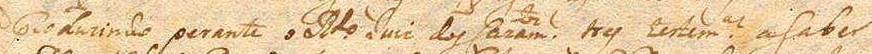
pRoduzindo perante o Rdo Iuiz dos Cazam.tos tres testem.as a saber
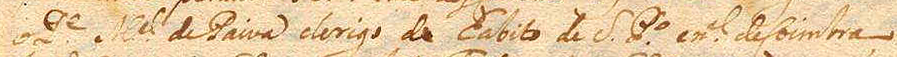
o P.e Mel de Paiva clerigo do habito de S. P.o e n.al de Coimbra
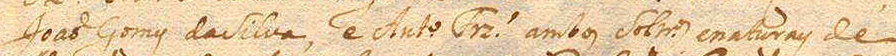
Joaõ Gomes da Silva, e Ant.o Frz̄. ambos Soltr.os e naturaes de
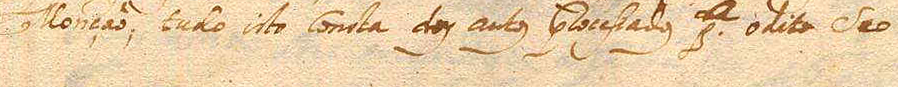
Monçaõ; tudo isto consta dos autos processados p.a o dito Seo
